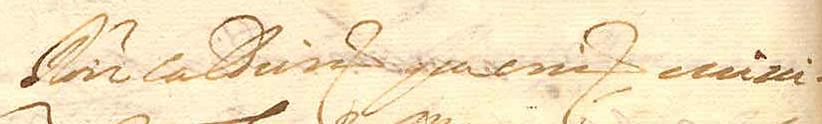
Roiz̄ caldeiraõ que criaõ e uiui
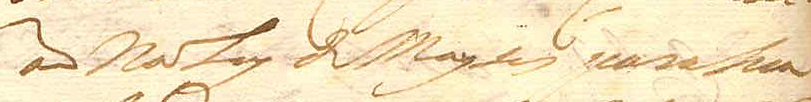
aõ na Ley de Moyses para sua
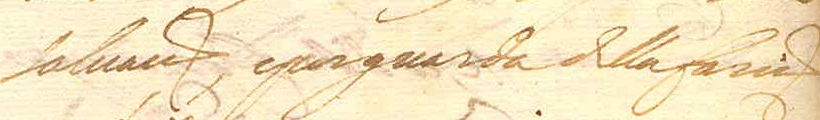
saluação, e por guarda della faziaõ
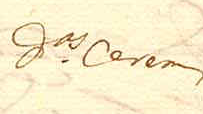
d.as cerem
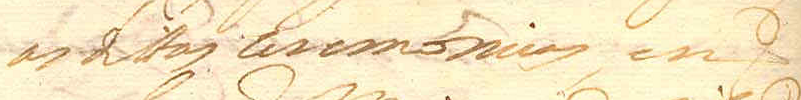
as dittas ceremonias e naõ
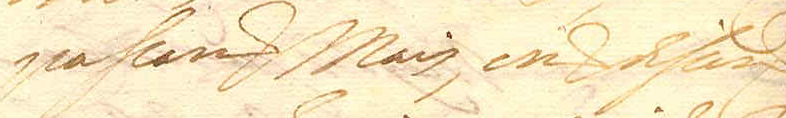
passaraõ Mais, e naõ disseraõ
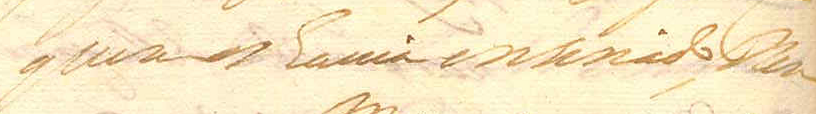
quem os hauia ensinado Nem
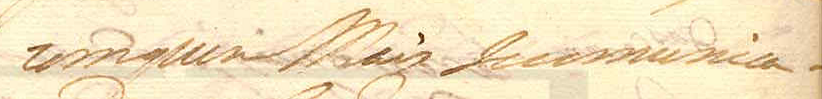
com quem Mais se comunica
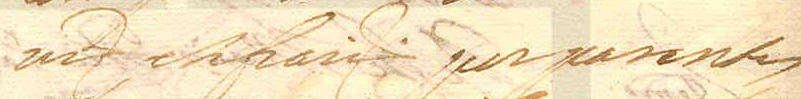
uaõ e se faziaõ por parentes
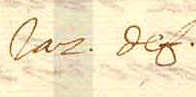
Raz. def.
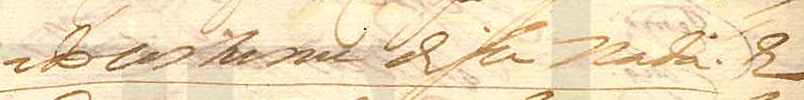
e do costume disse nada. E
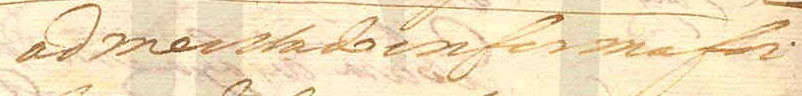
admoestado en forma foi
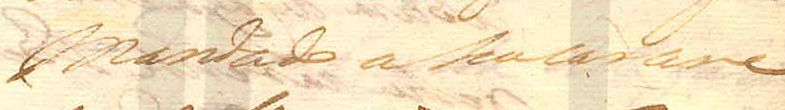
Mandado a seu carcere
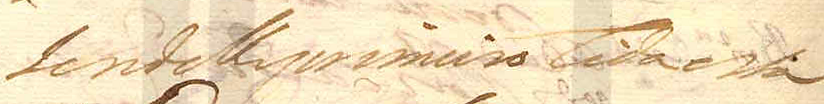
sendolhe primeiro lida esta
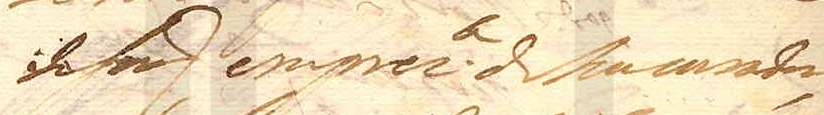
diseraõ em prez.a de seu curador
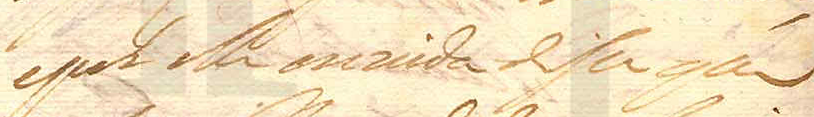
e por elle ouuida disse que
